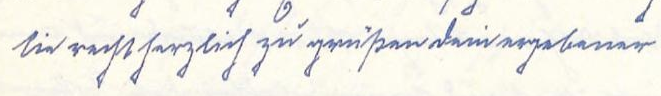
lie recht herzlich zu grüßen dein ergebener
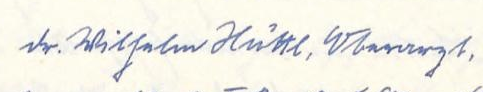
Dr. Wilhelm Hüttl, Oberarzt,
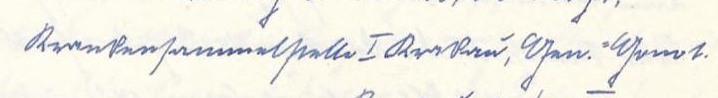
Krankensammelstelle Krakau, Gen. Gonot.
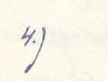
4)
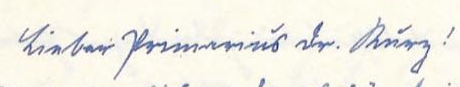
Lieber Primarius Dr. Kurz!
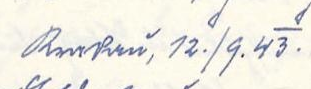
Krakau, 12. /9.43.
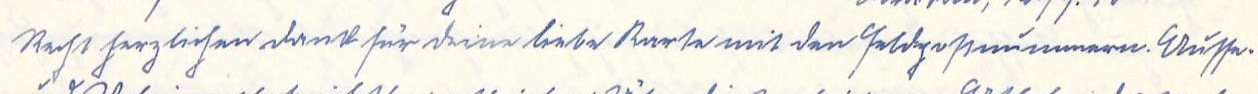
Recht herzlichen Dank für deine liebe Karte mit den Feldpostnummern. Ausse-
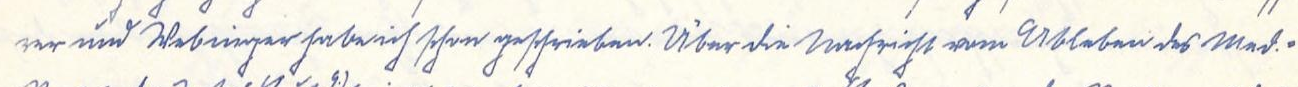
rer und Webinger habe ich schon geschrieben. Über die Nachricht vom Ableben des Med.-
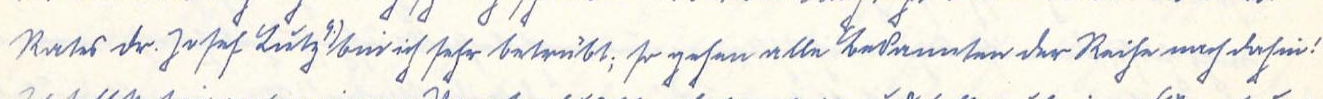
Rats Dr. Josef Lutz 9) ich sehr betrübt; so gehen alle Bekannten der Reihe nach dahin!
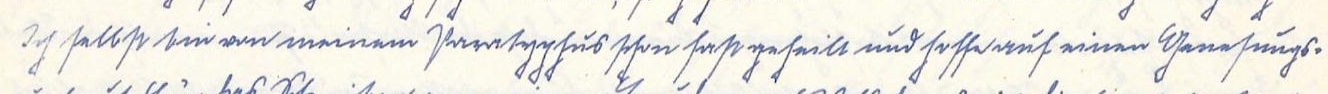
Ich selbst bin von meinem Paratyphus schon fast geheilt und hoffe auf einen Genesungs-
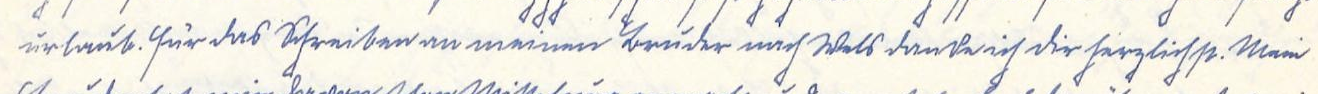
urlaub. Für das Schreiben an meinen Bruder nach Wels danke ich dir herzlichst. Mein
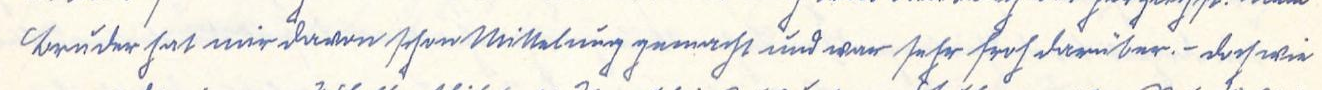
Bruder hat mir davon schon Mitteilung gemacht und war sehr froh darüber.- Doch wie
